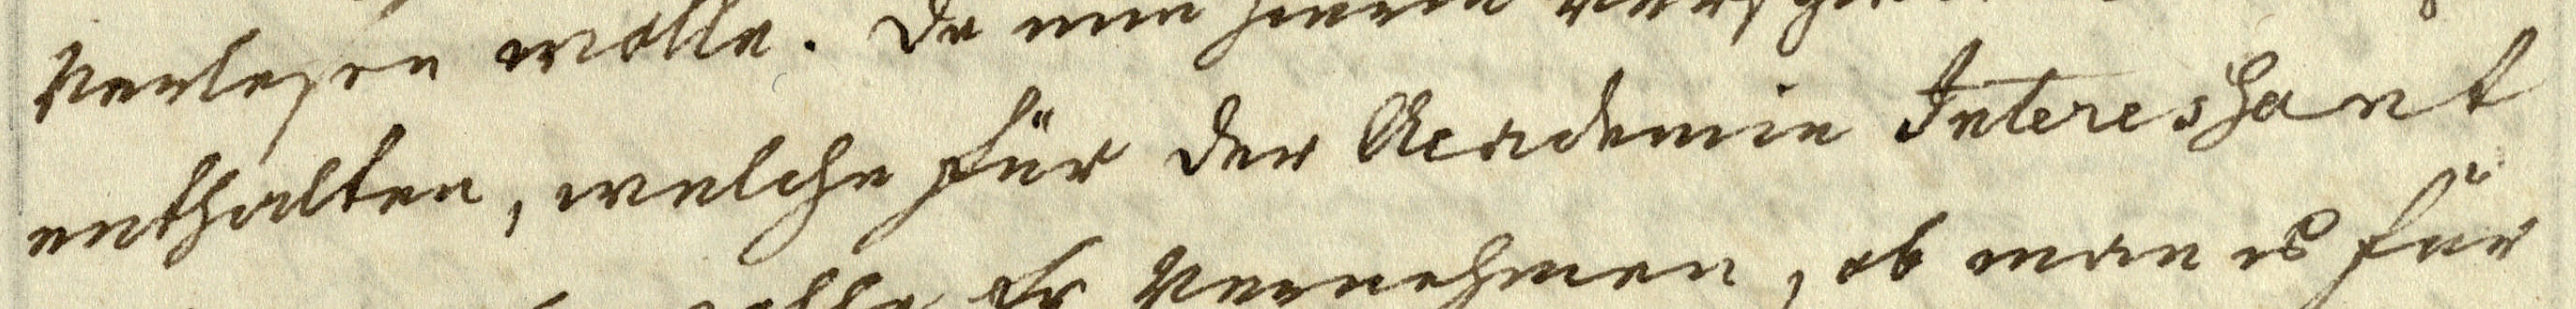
enthalten, welche für der Academie Interessant
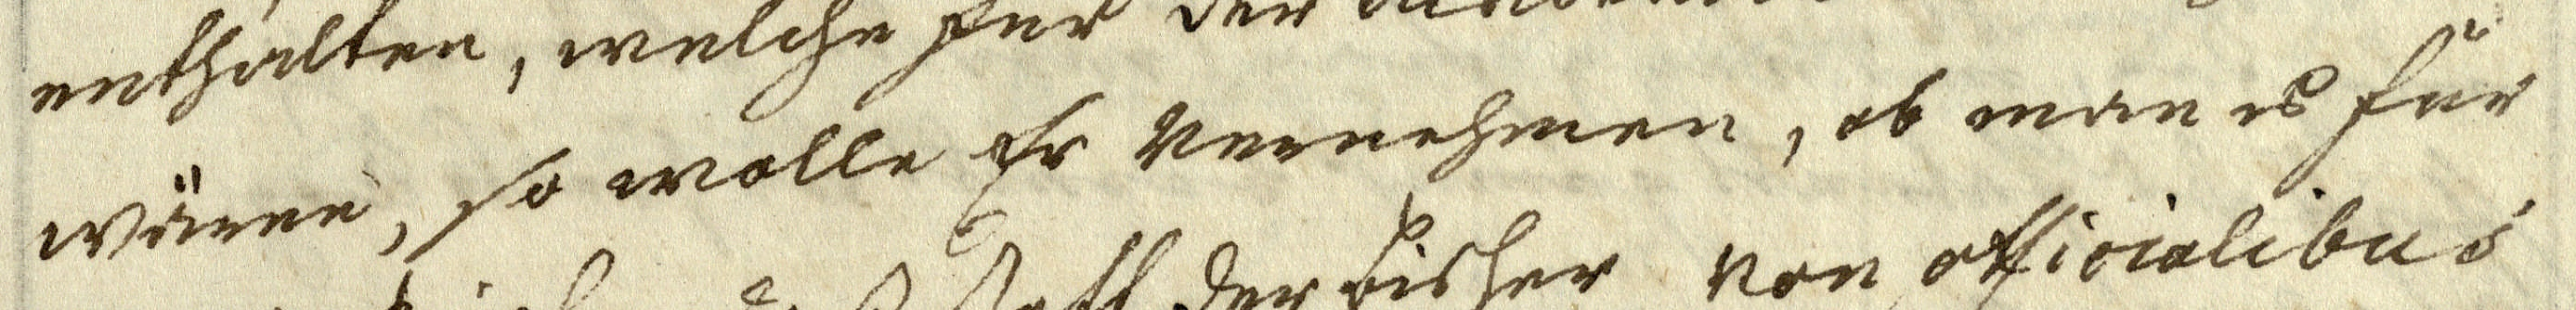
wären, so wolle Er vernehmen, ob man es für
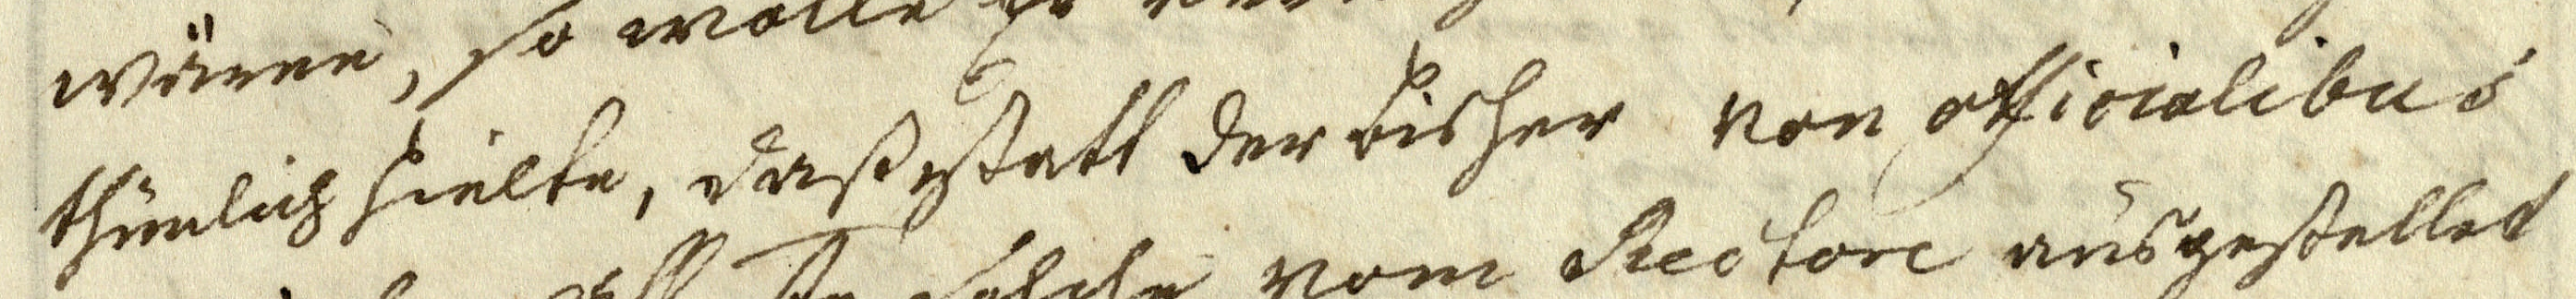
thunlich hielte, daß statt der bisher von officialibus
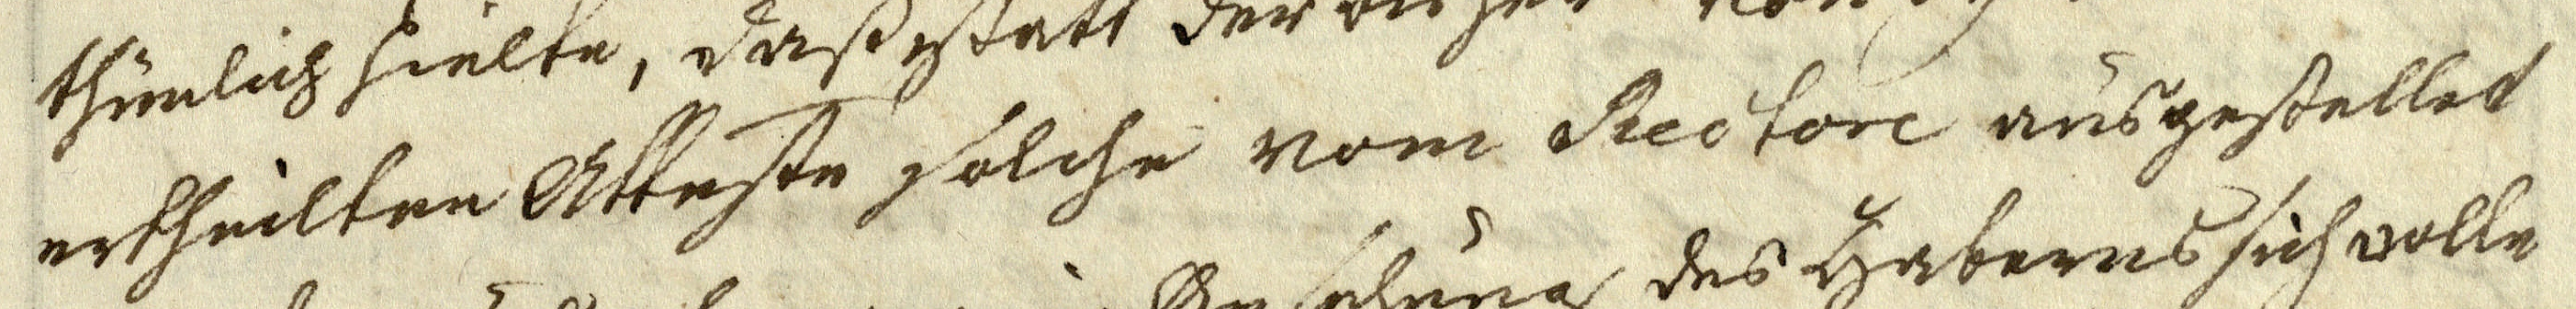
ertheilten Atteste solche vom Rectore ausgestellet
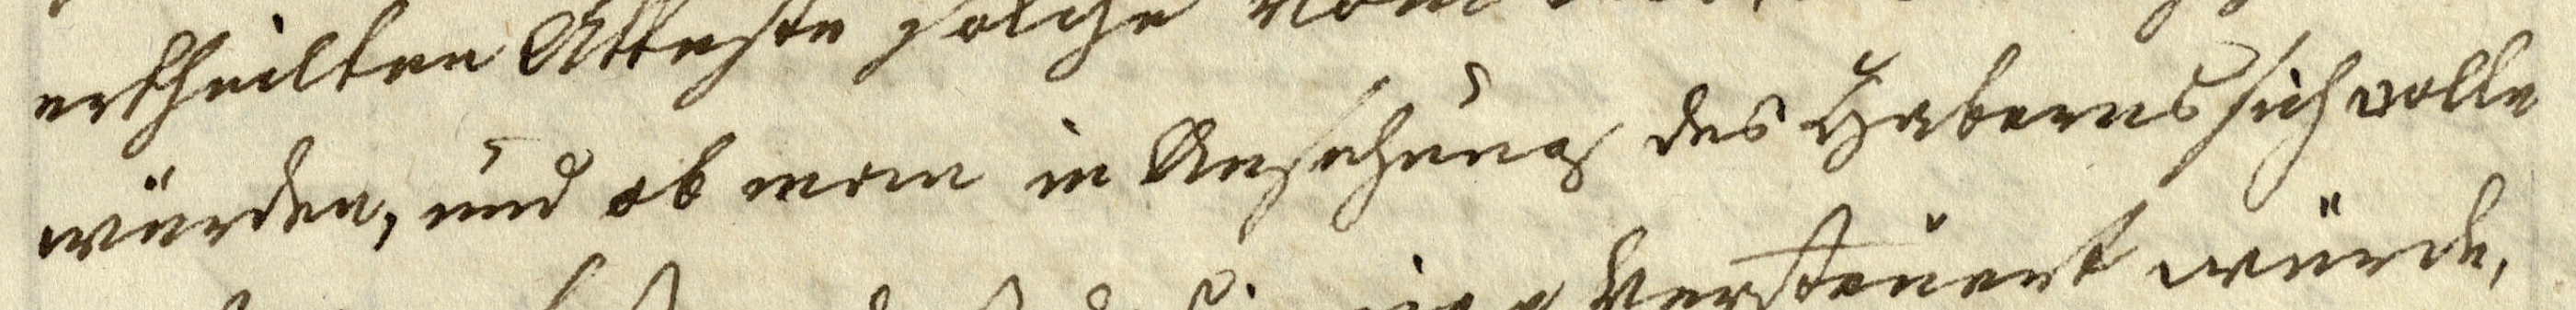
würden, und ob man in Ansehung des Haberns sich wolle
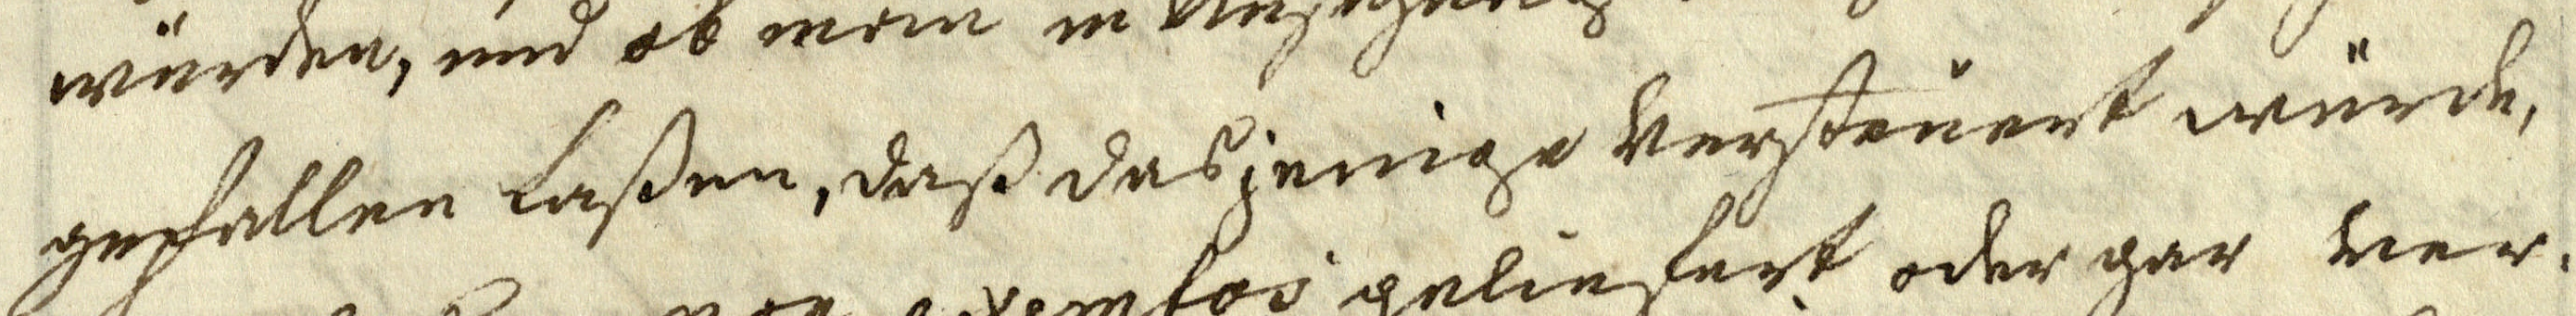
gefallen laßen, daß dasjenige versteuert würde,
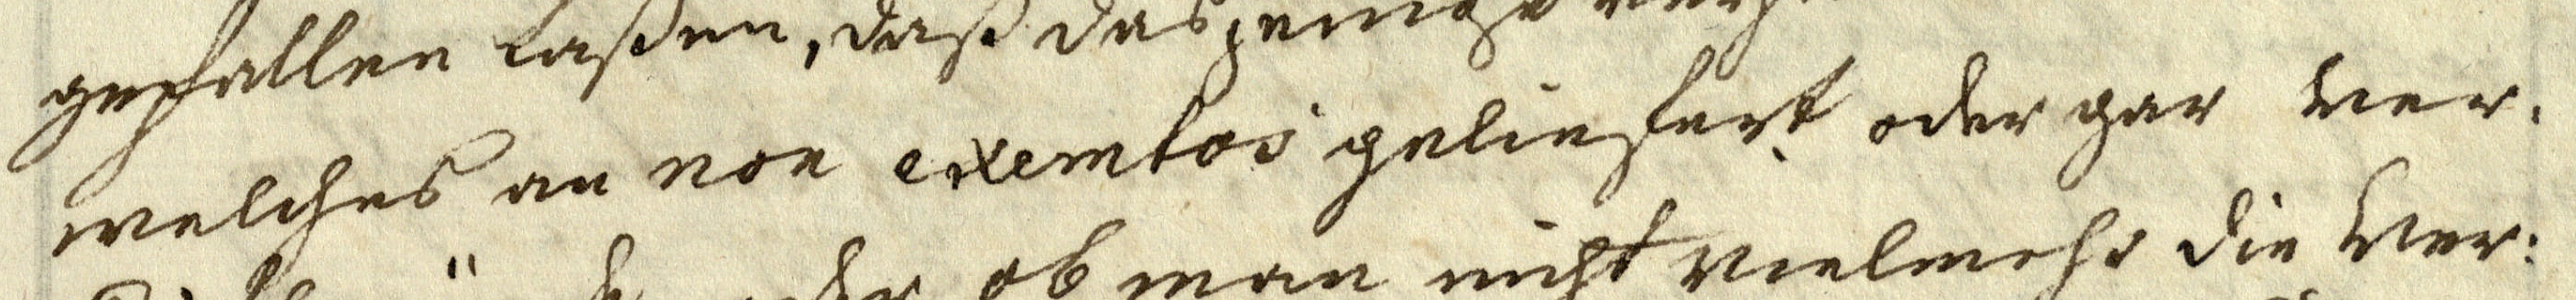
welches an non exemtos geliefert oder gar ver¬
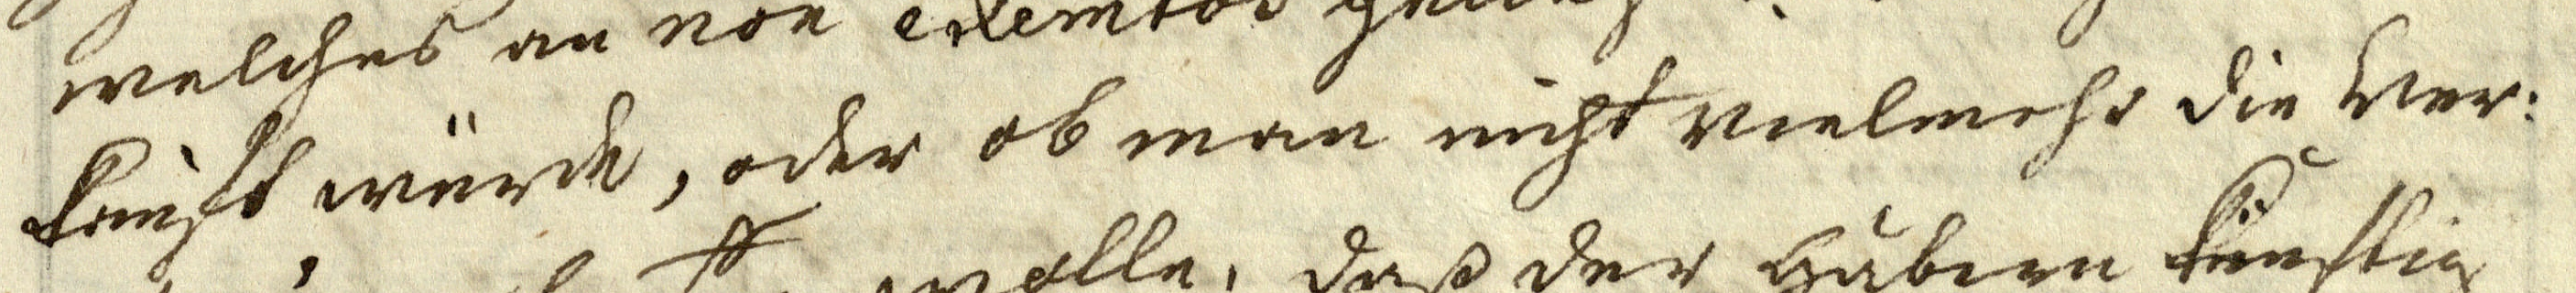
kauft würde, oder ob man nicht vielmehr die Ver¬
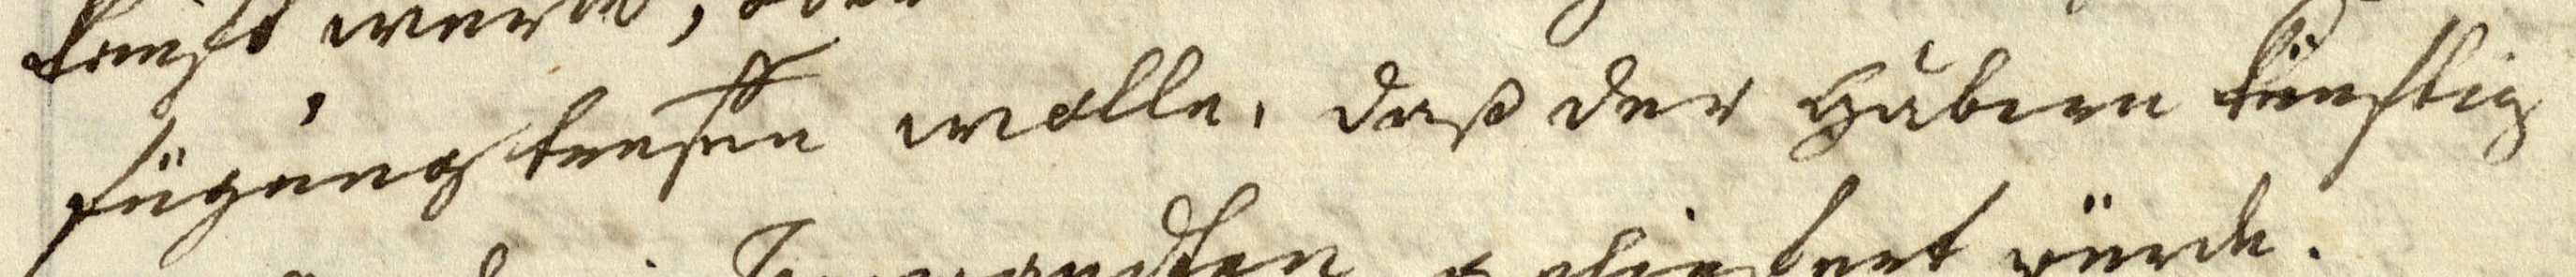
fügung trefen wolle, daß der Habern künftig
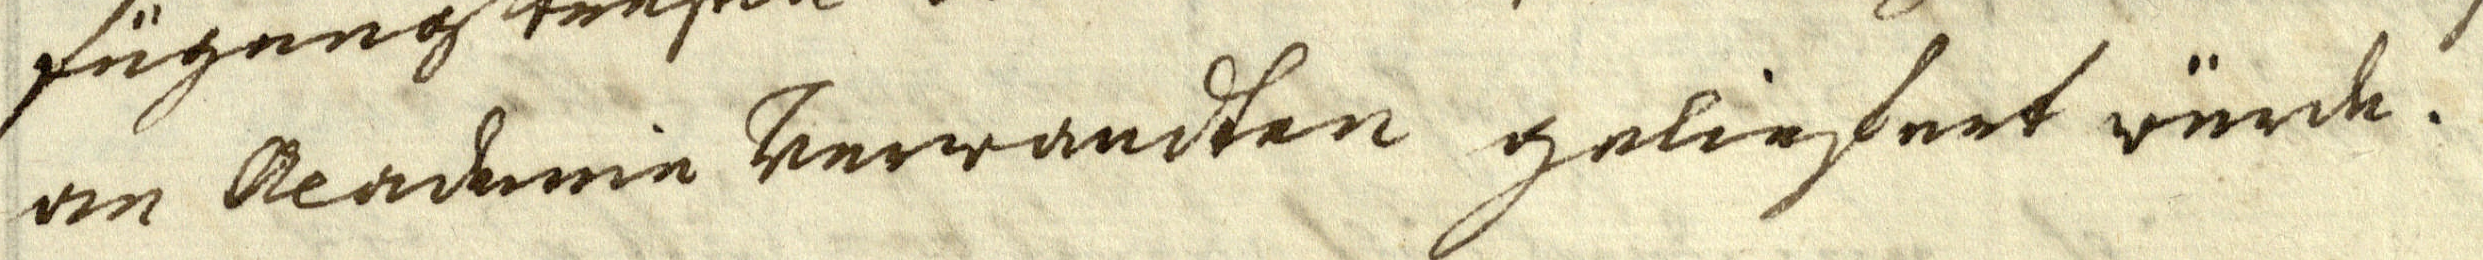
an Academie Verwandten geliefert würde.
